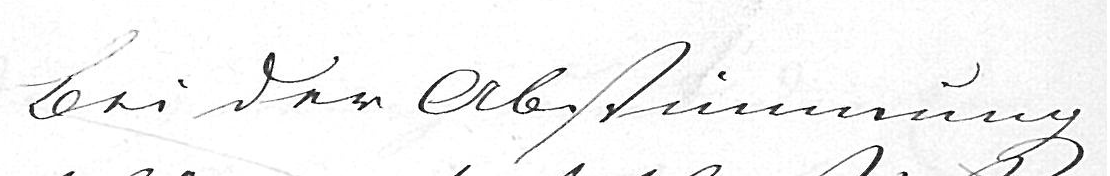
Bei der Abstimmung
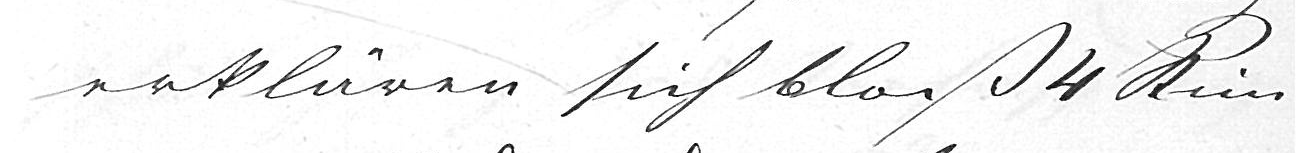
erklären sich bloß 4 Stim-
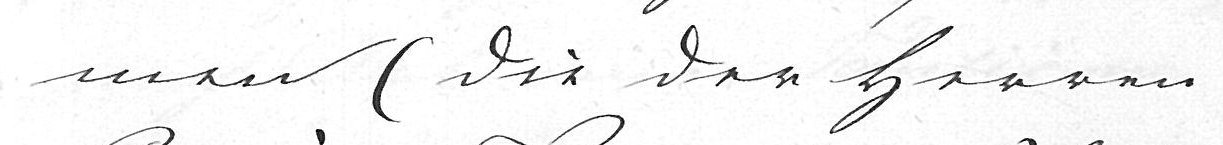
men (die der Herren
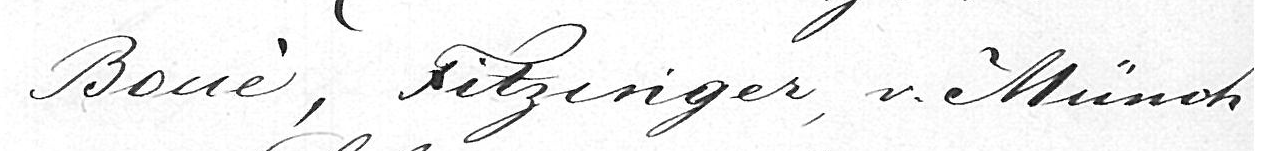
Bouè, Fitzinger, v. Münch
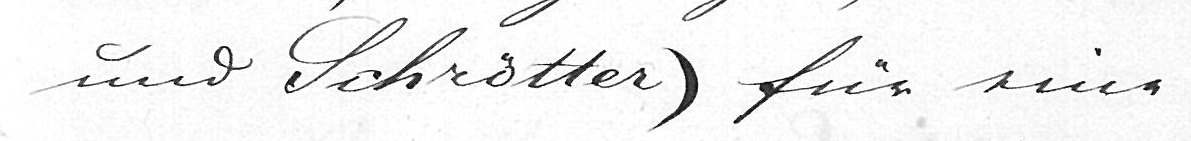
und Schrötter) für eine
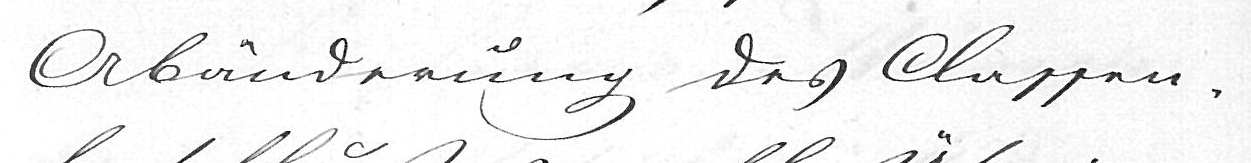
Abänderung des Classen-
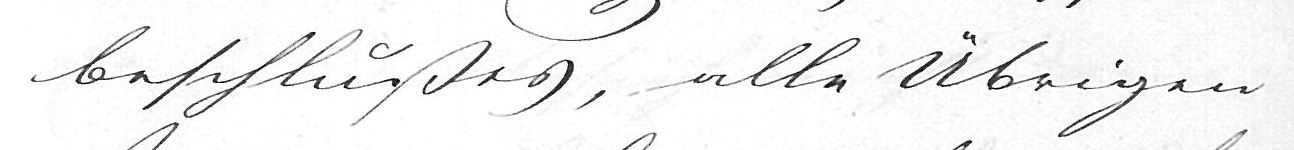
beschlußes, alle Übrigen
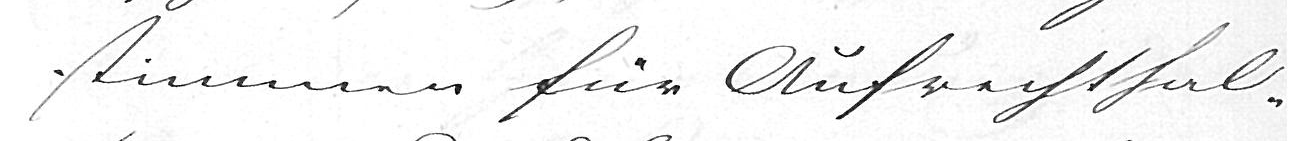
stimmen für Aufrechthal-
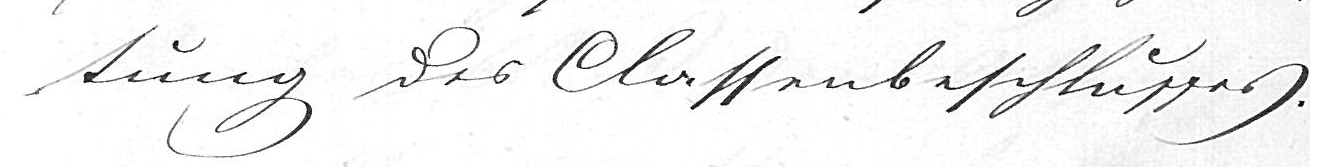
tung der Classenbeschlusses.
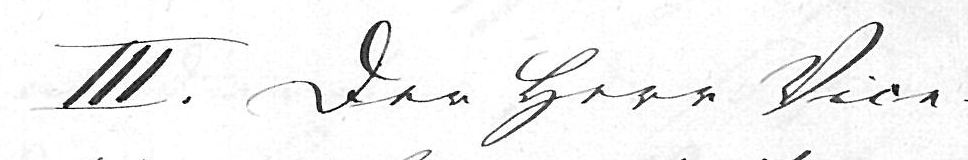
III. Der Herr Vice-
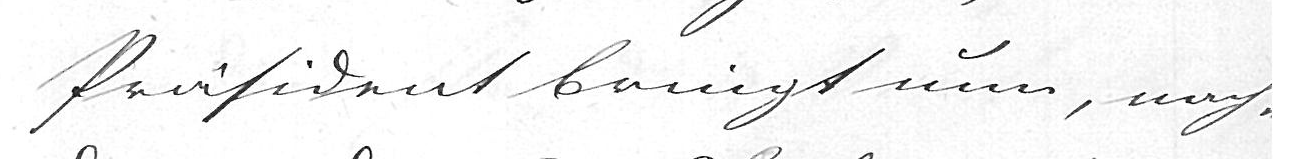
Präsident bringt nun, nach-
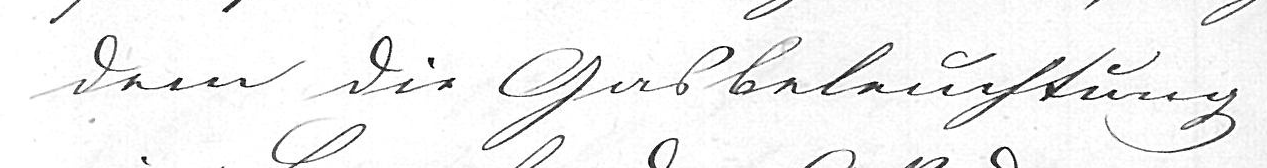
dem die Gasbelechtung
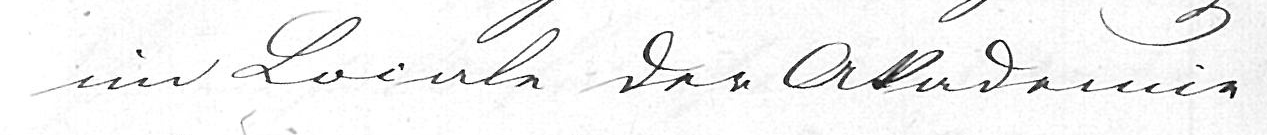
im Locale der Akademie
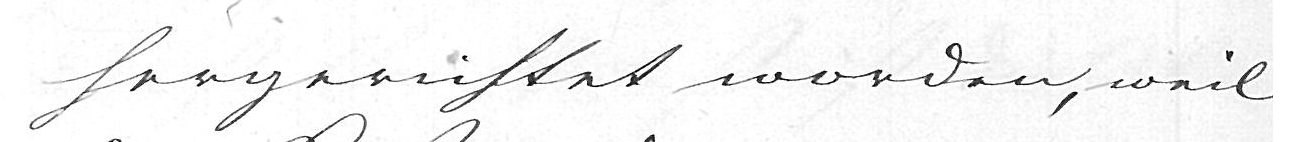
hergerichtet worden, weil
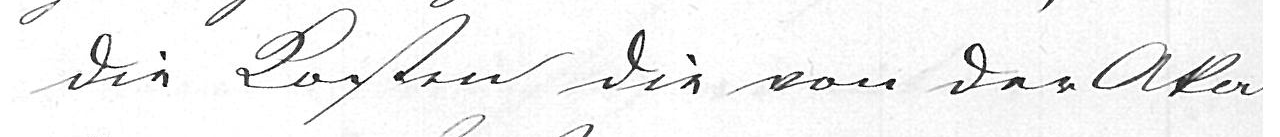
die Kosten die von der Aka-
